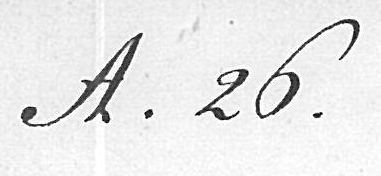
A. 26.
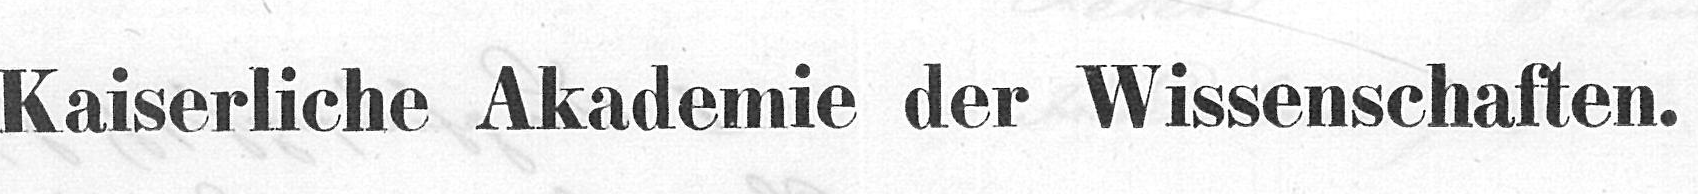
Kaiserliche Akademie der Wissenschaften.
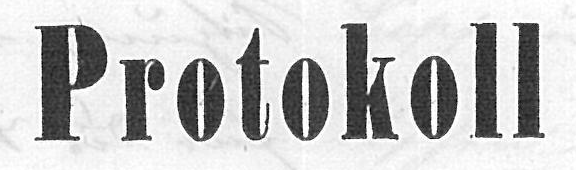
Protokoll
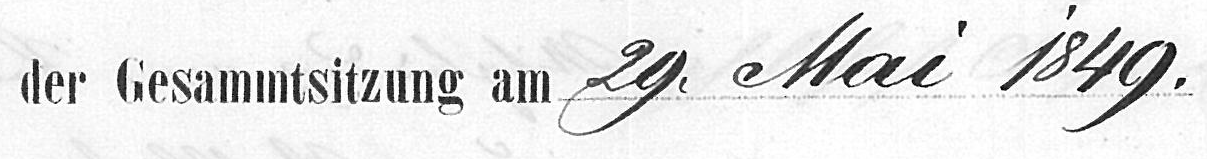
der Gesammtsitzung am 29. Mai 1849.
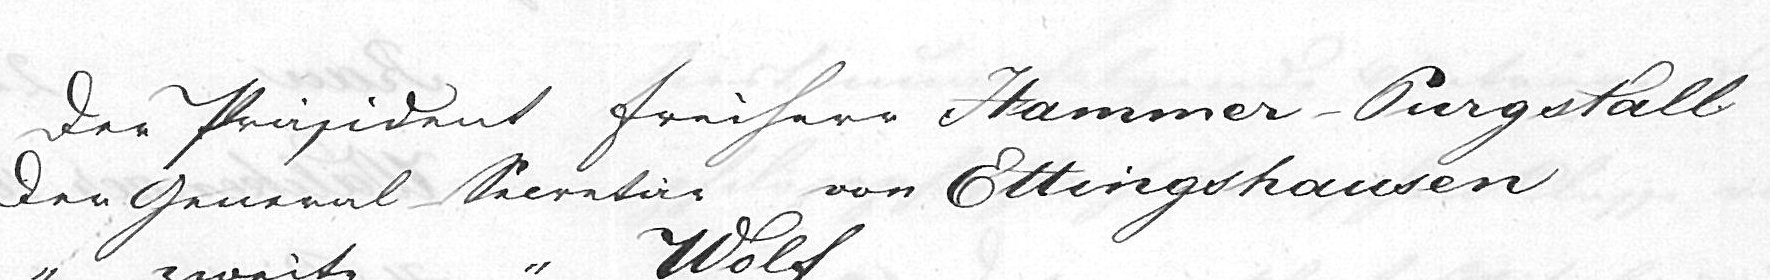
der Präsident Freiherr Hammer-Purgstall
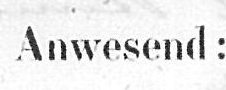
Anwesend:
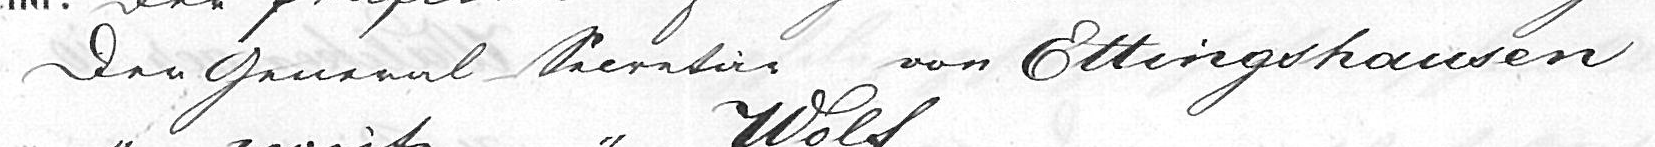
Der General-Secretär von Ettingshausen
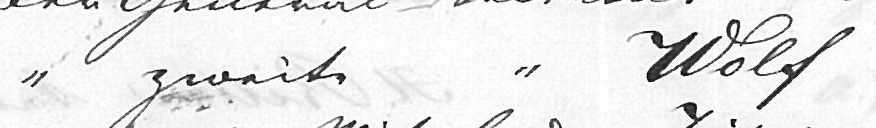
" zweite " Wolf
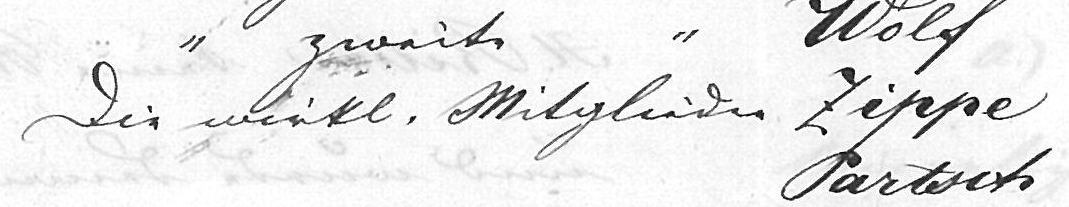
Die wirkl. Mitglieder Zippe
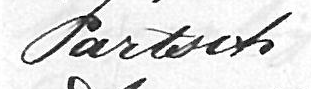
Partsch
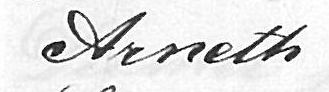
Arneth
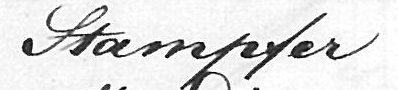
Stampfer
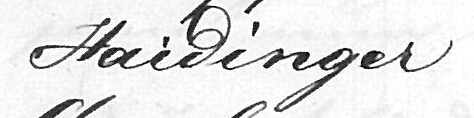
Haidinger
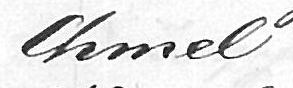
Chmel
